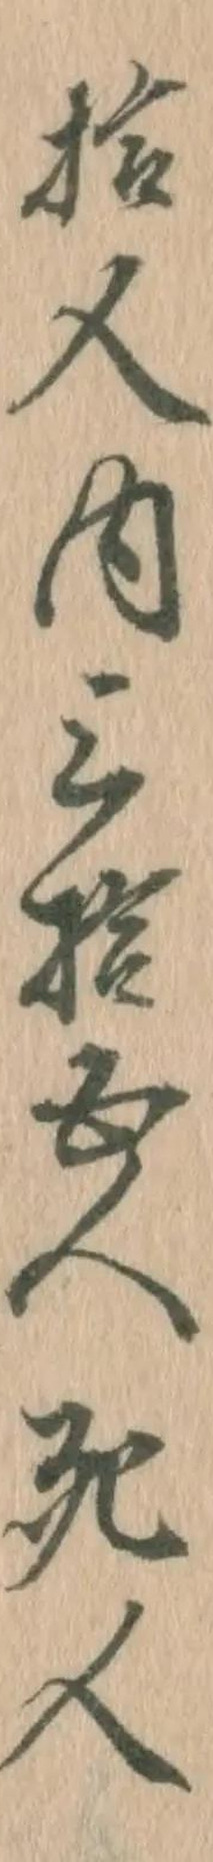拾人内三拾五人死人
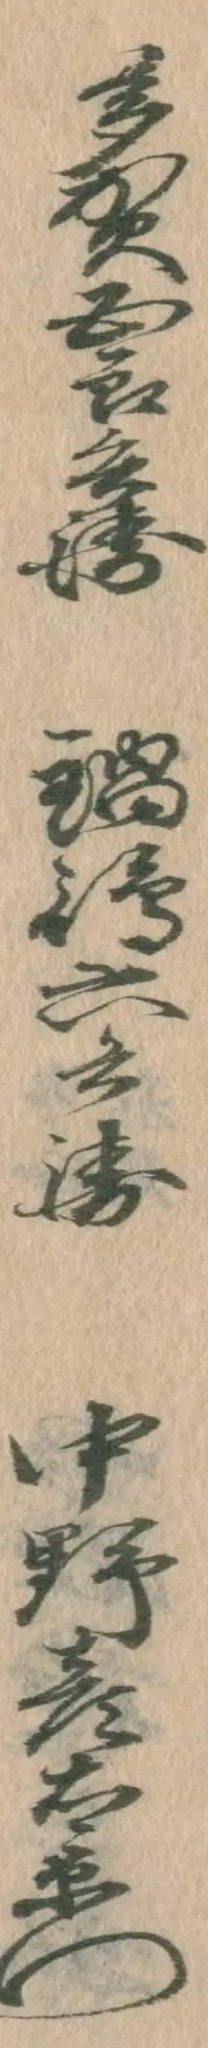多賀五郎兵衛鍋島六兵衛中野彦右衛門
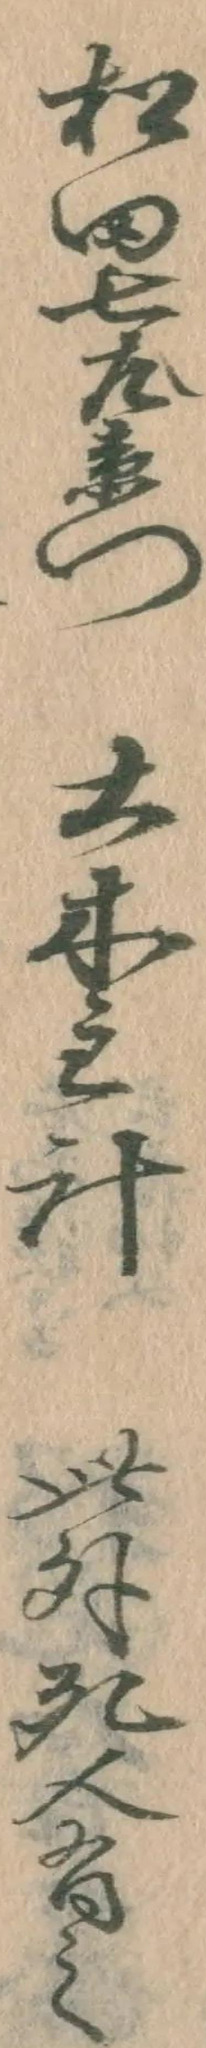松田七左衛門大木主計此外死人有之
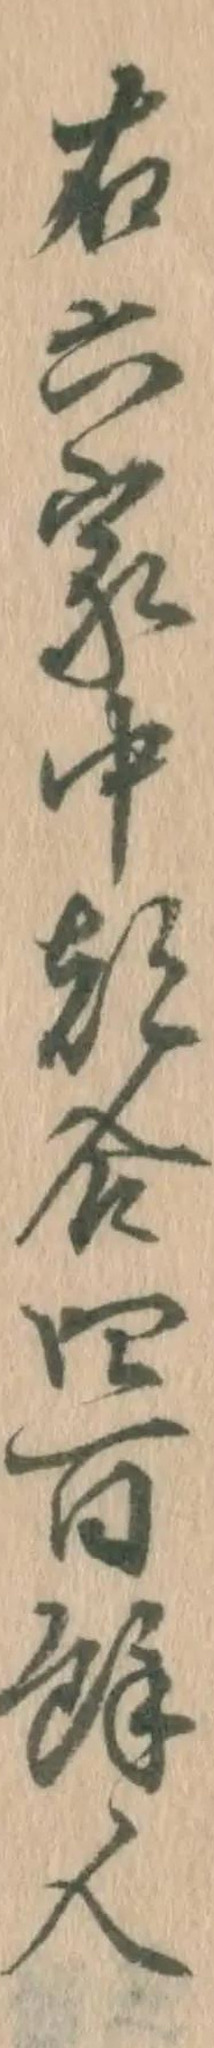右六家中都合四百余人
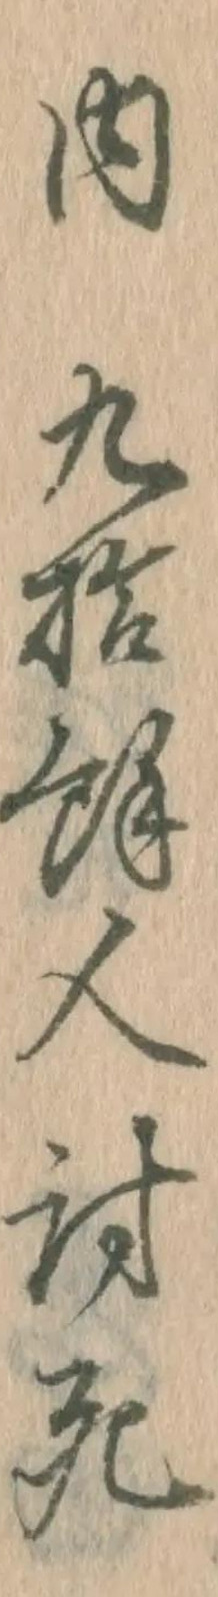内九拾余人討死
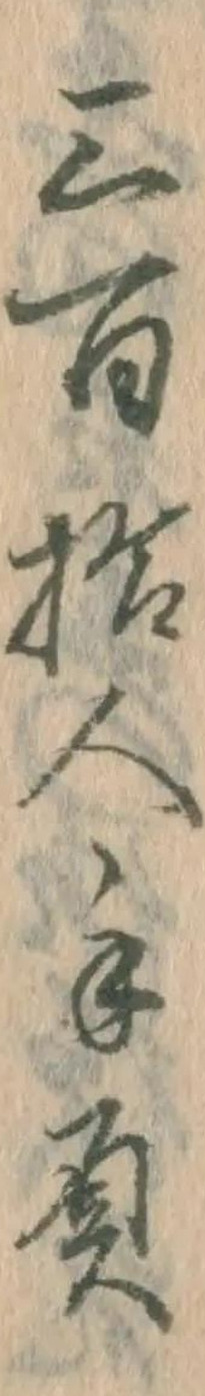三百拾人手負
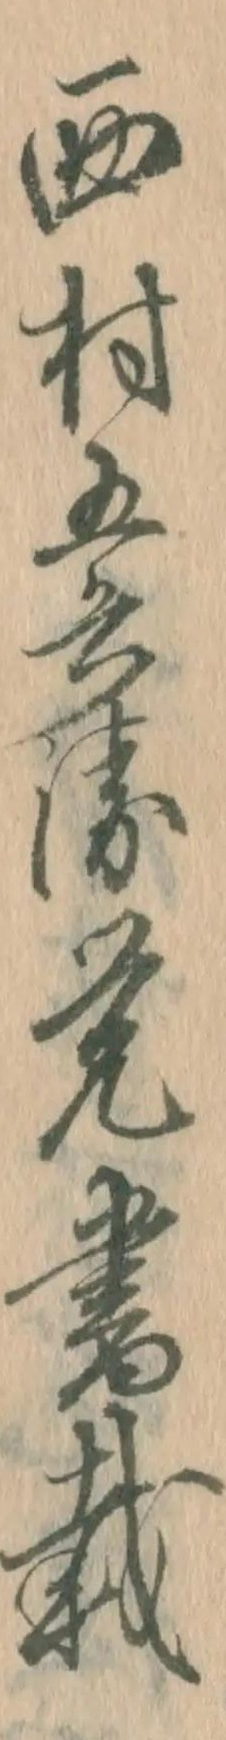西村五兵衛覚書載

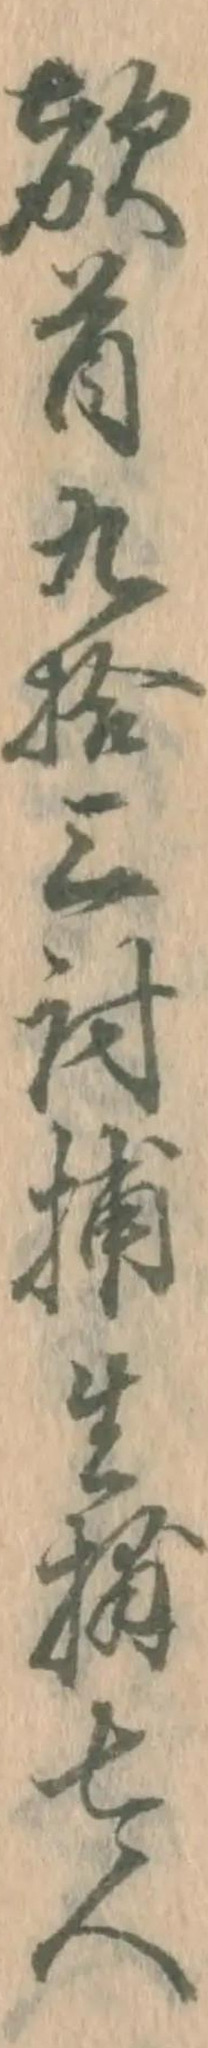敵首九拾三討捕生捕七人
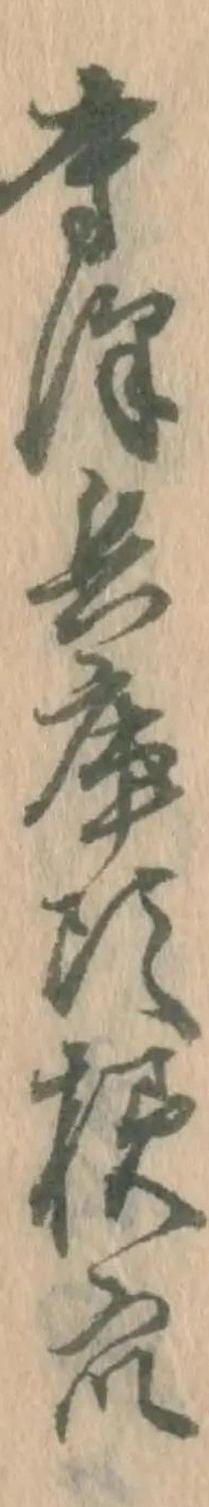寺沢兵庫頭様衆
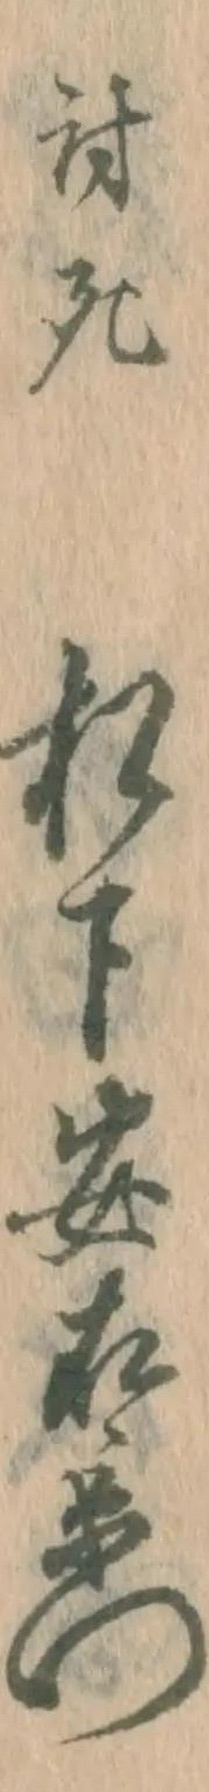討死松下安右衛門
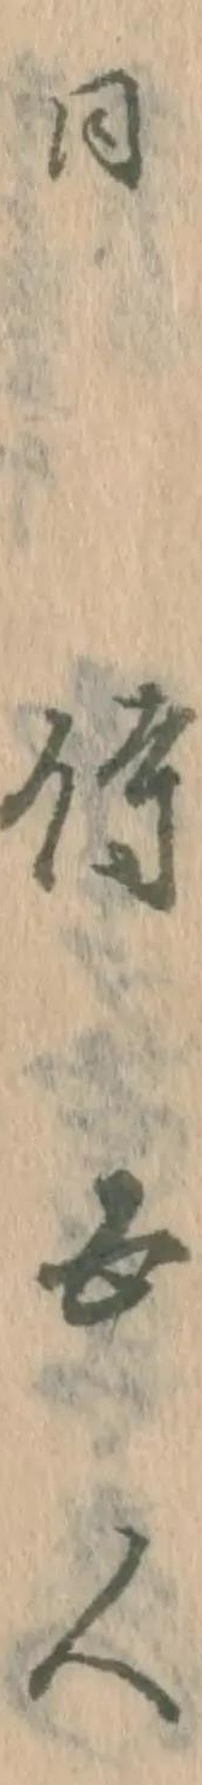同侍五人
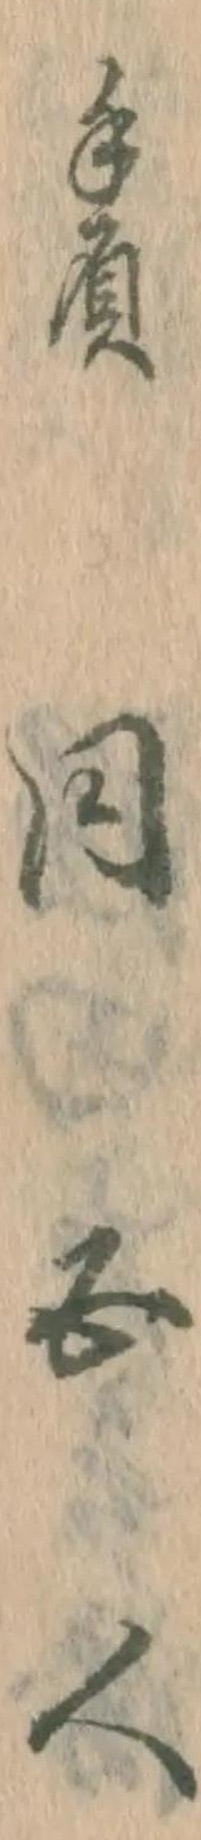手負同五人
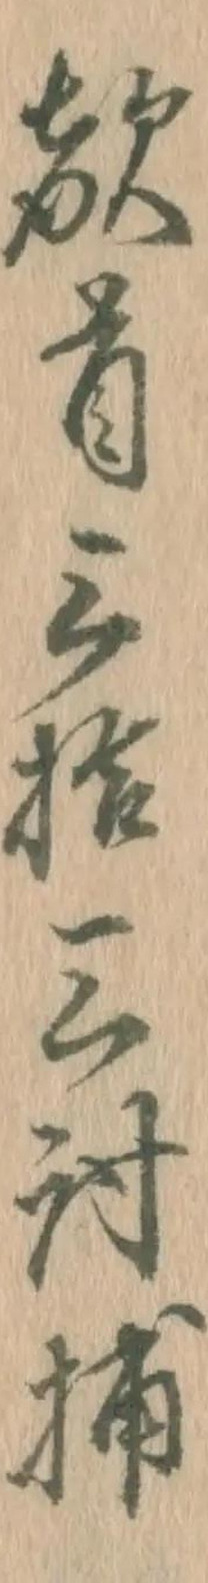敵首三拾三討捕
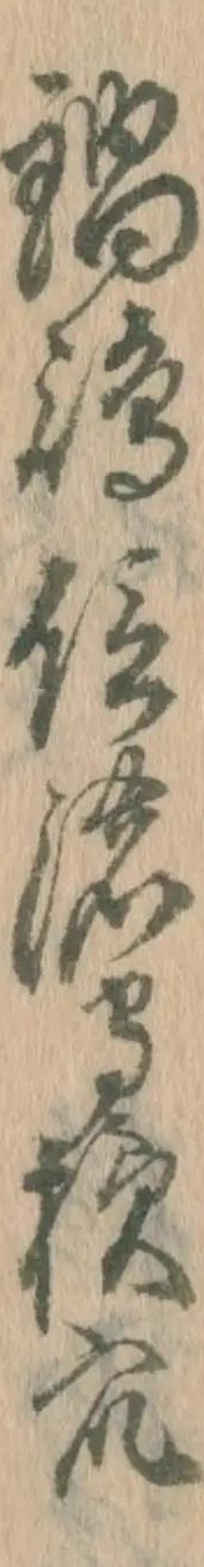鍋島信濃守様衆
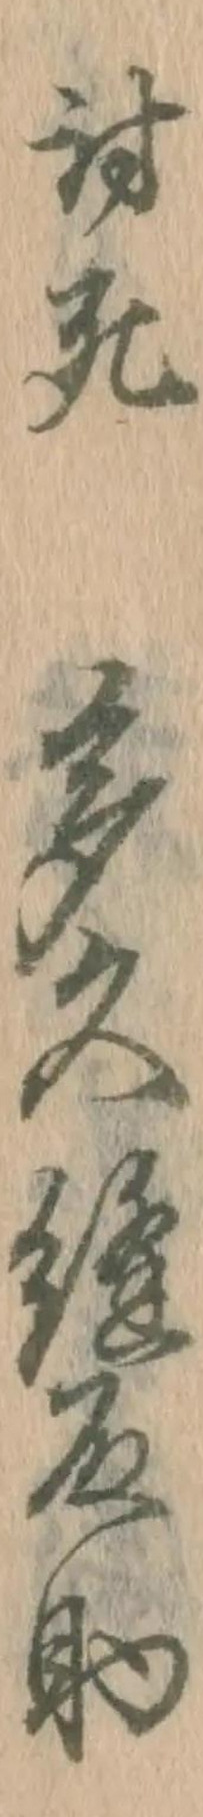討死多久縫殿助
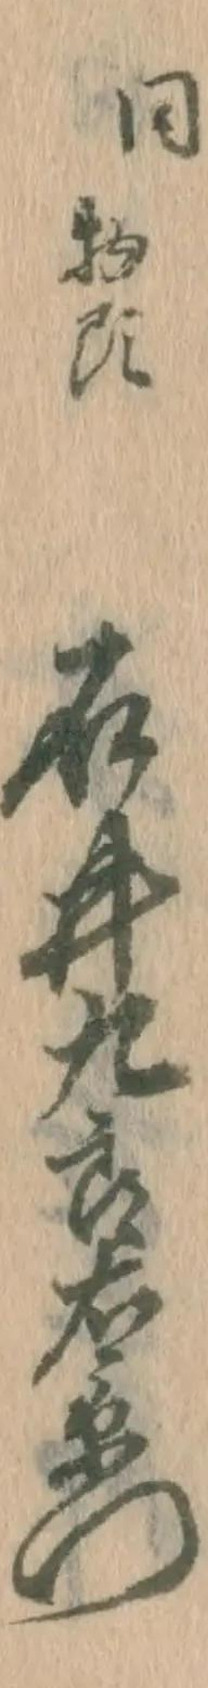同物頭石井九郎右衛門
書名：切支丹御退治記 49巻. [7]
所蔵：国立国会図書館 National Diet Library, JAPAN
